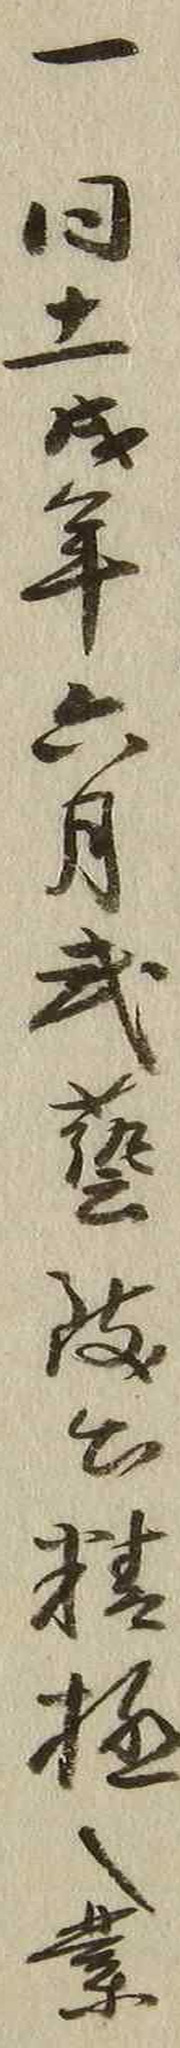一同十一戌年六月武芸致出精極之業
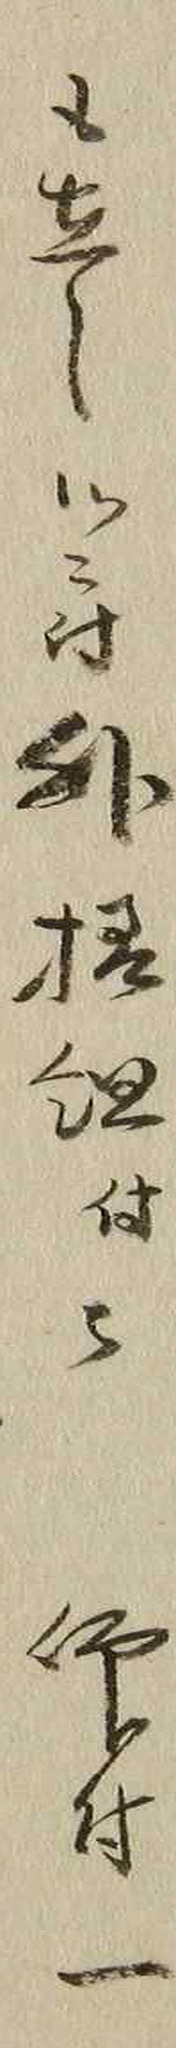も在之候ニ付外様組付被仰付一
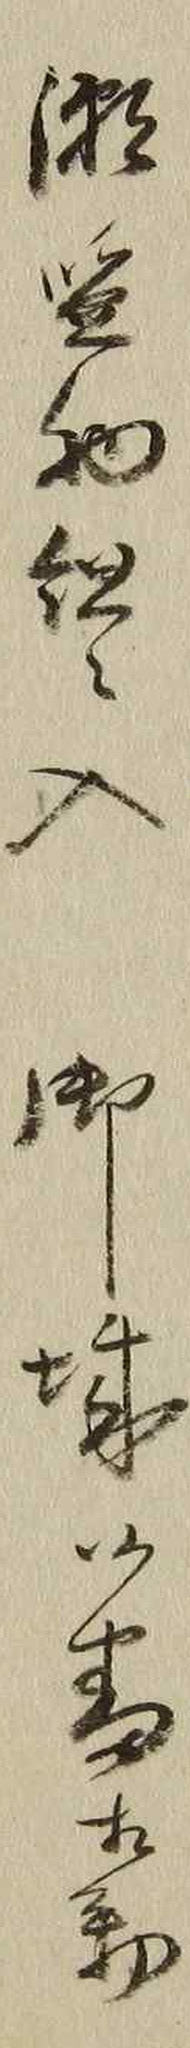瀬監物組ニ入御城御番相勤
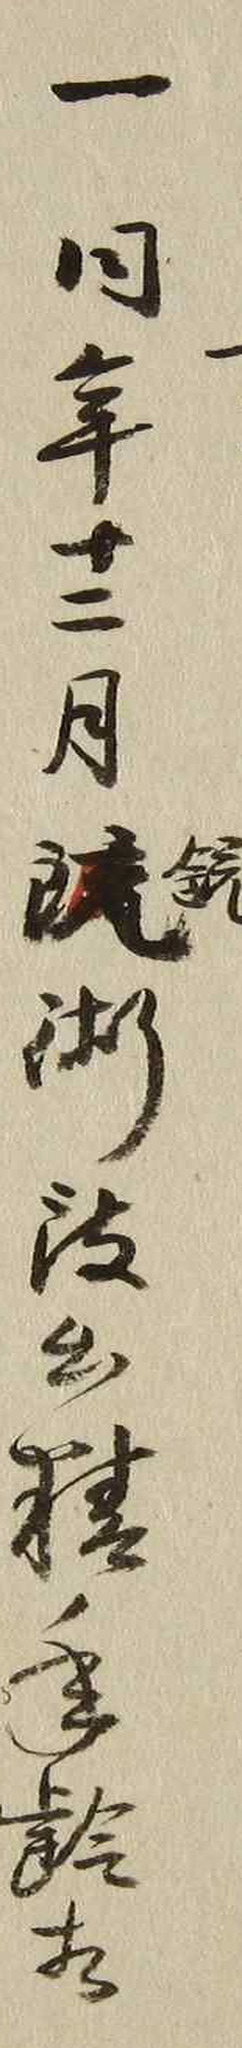一同年十二月銃術致出精年齢相
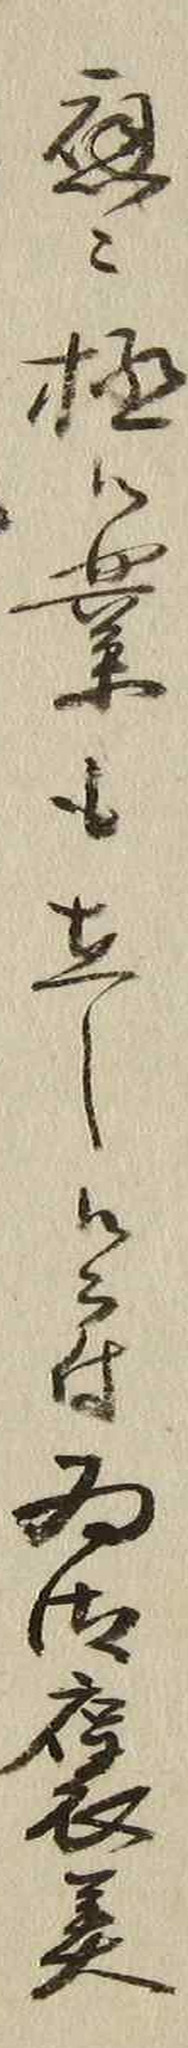応ニ極候業も在之候ニ付為御褒美
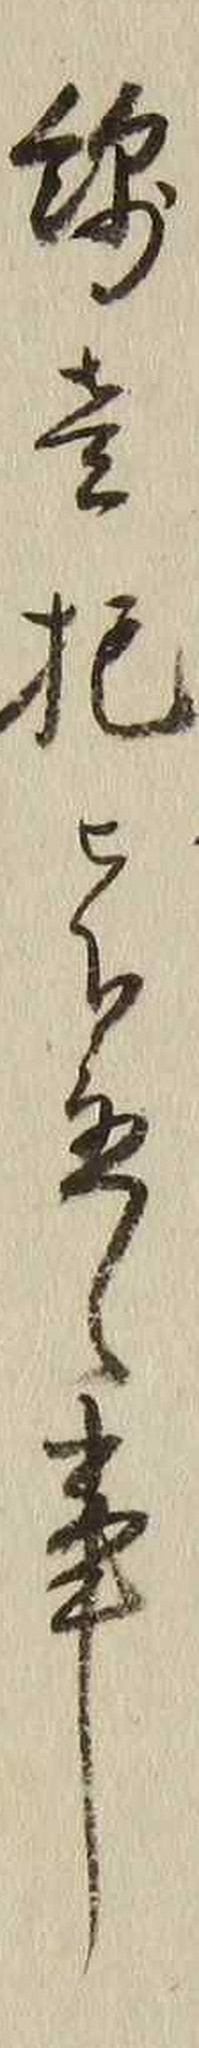綿壱把被下置候事
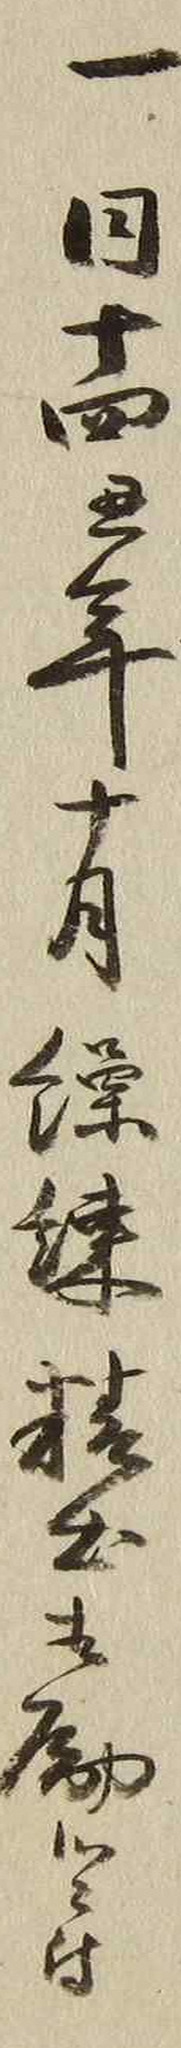一同十四丑年十月繰錬精出相励候ニ付
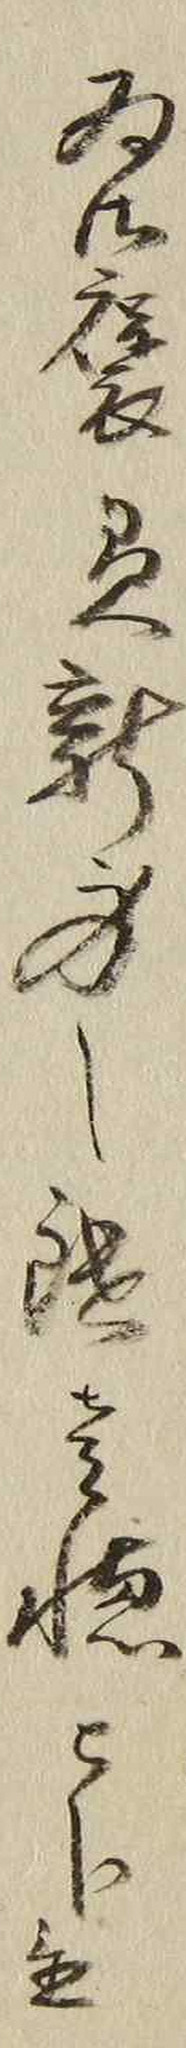為御褒美新身之鑓壱穂被下置
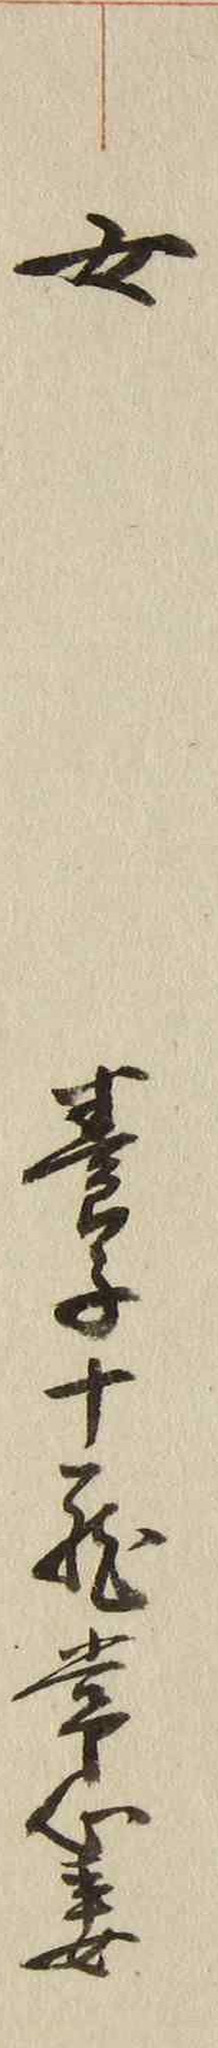女養子十蔵常心妻

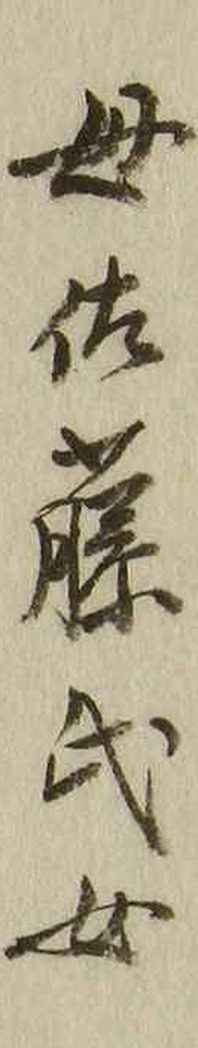母佐藤氏女
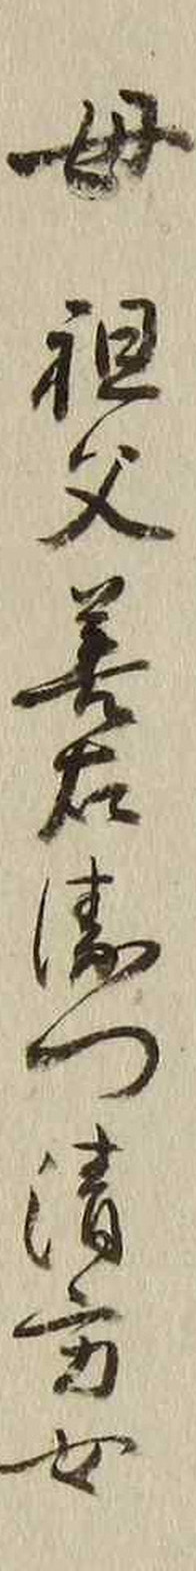母祖父善右衛門清方女
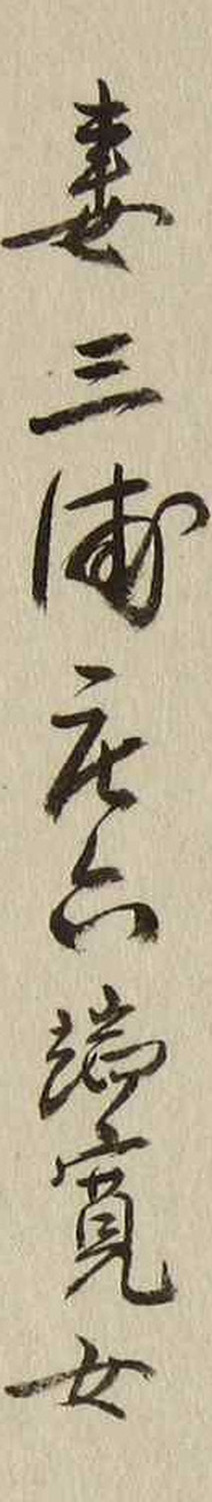妻三浦庄六端寛女
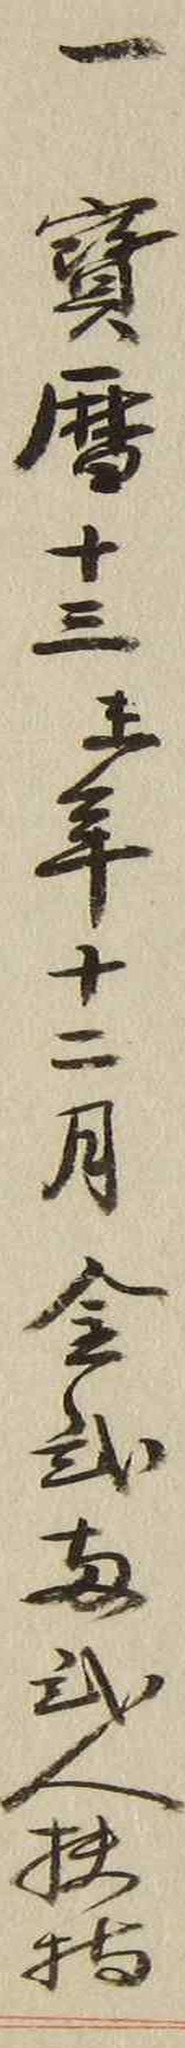一宝暦十三未年十二月金弐両弐人扶持
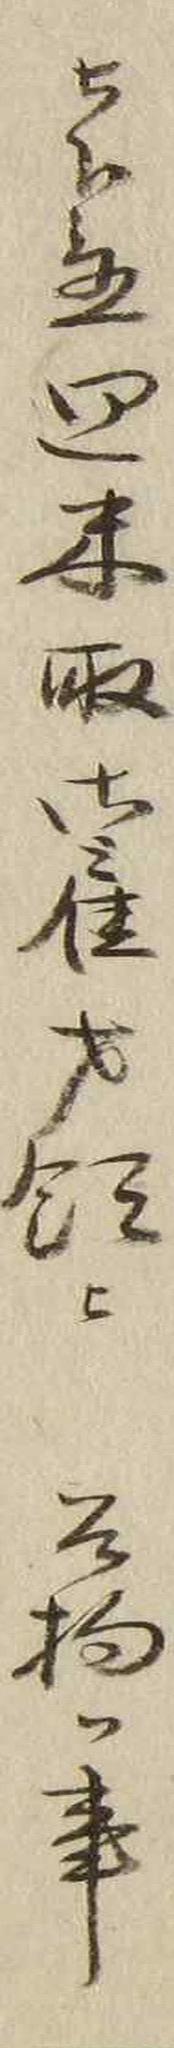被下置廻米取御雇才領被召抱候事

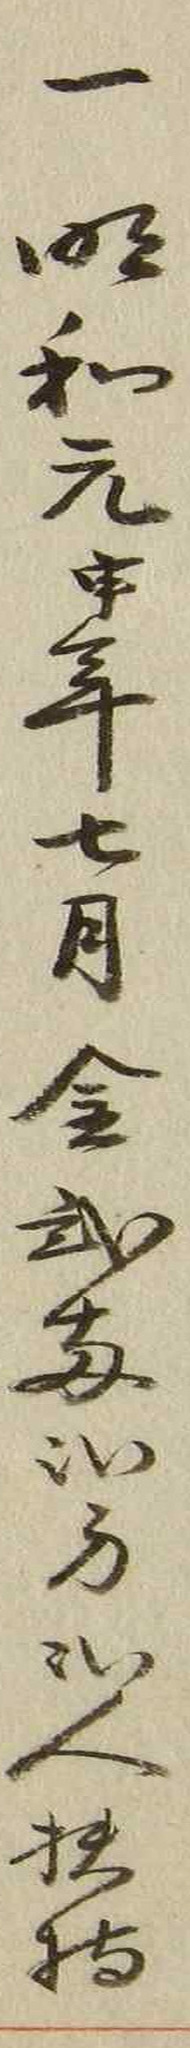一明和元申年七月金弐両弐分弐人扶持
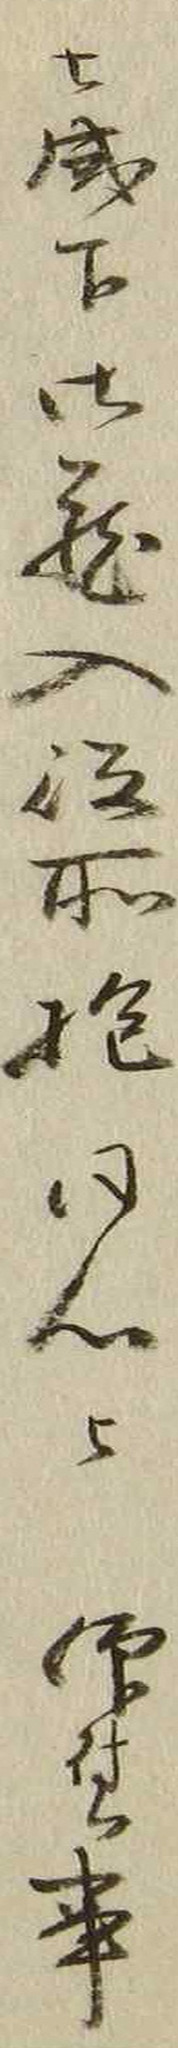被成下御蔵入役所抱同心被仰付候事
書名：諸士系譜　巻之236　ふ之部4
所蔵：会津若松市立会津図書館
